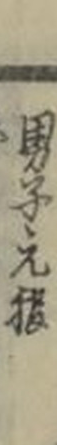男子元服
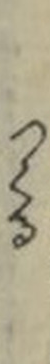つくる
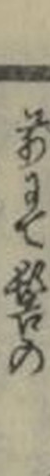前にて髻の
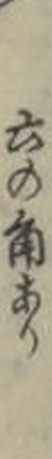六の角あり
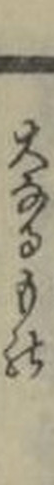大なるもの
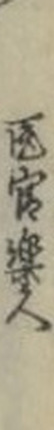医官楽人
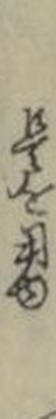是を用ゆ
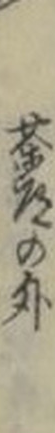茶道の外
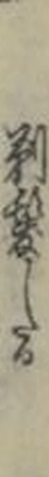剃髪したる
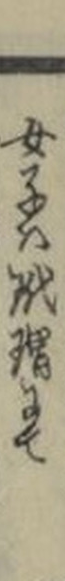女子は玳瑁にて
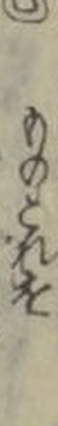ものこれを
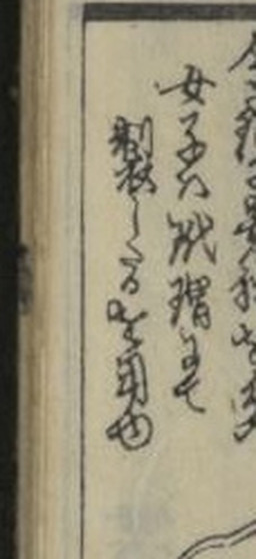製したるを用ゆ

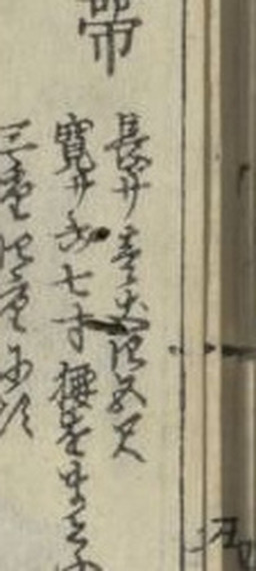長サ壱丈四五尺
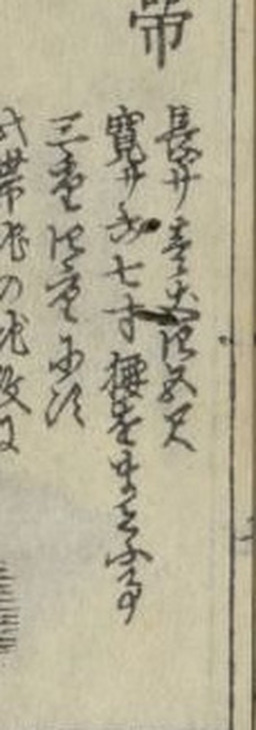寛サ六七寸腰をまとふ事
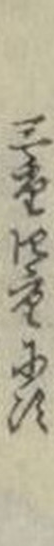三重四重にす
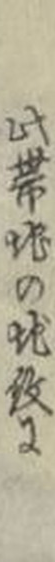此帯地の地紋に
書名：琉球解語
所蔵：University of the Ryukyus Library
